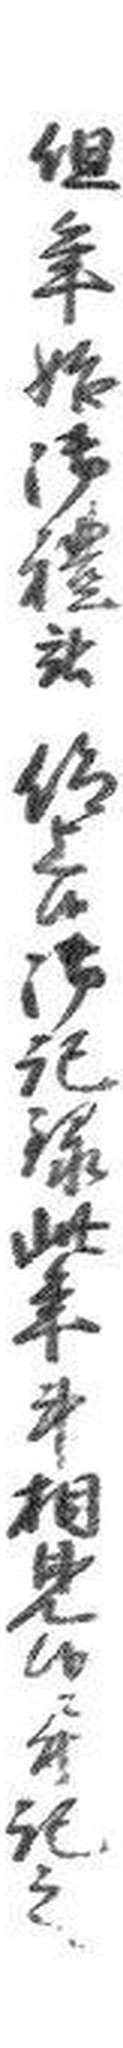但年始御礼被仰上候御記録此年計相見候二付記之
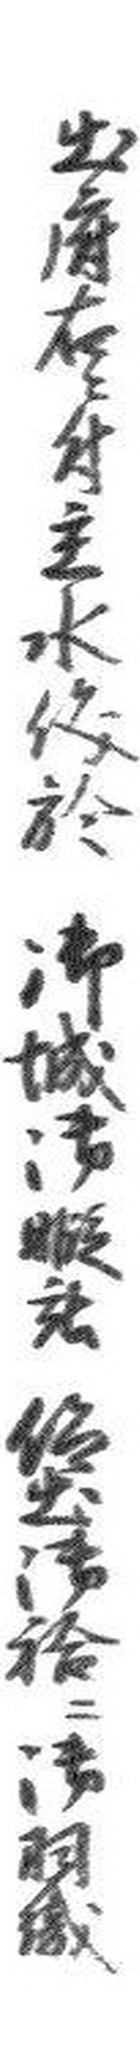出府右ニ付主水儀於御城御暇被仰出御袷ニ御羽織
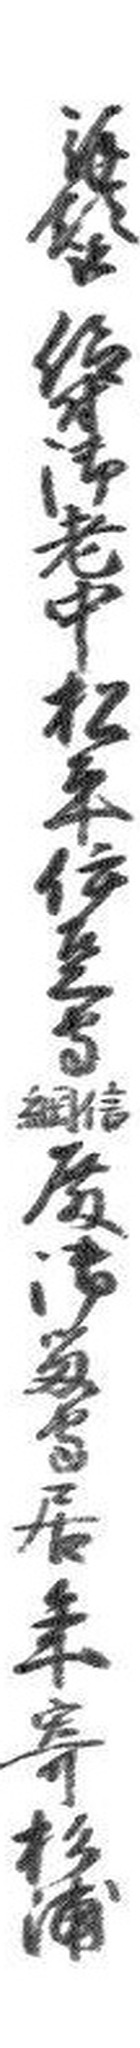拝領被仰付御老中松平伊豆守信綱殿御留守居年寄杉浦
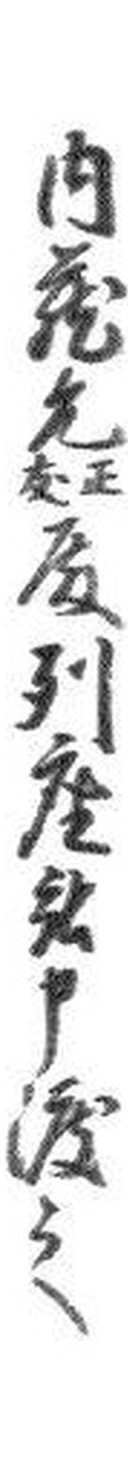内蔵允正友殿列座被申渡之
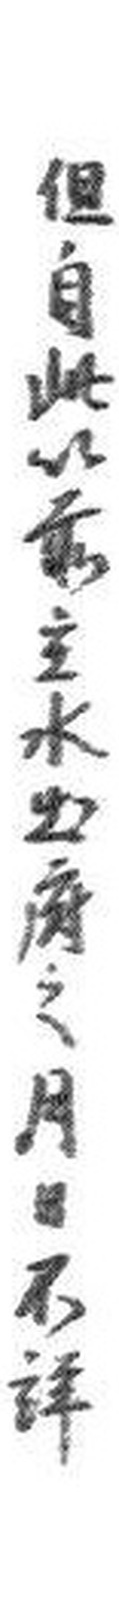但自此以前主水出府之月日不詳
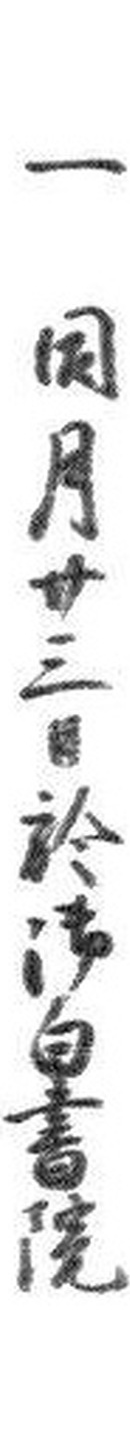一同月廿三日於御白書院
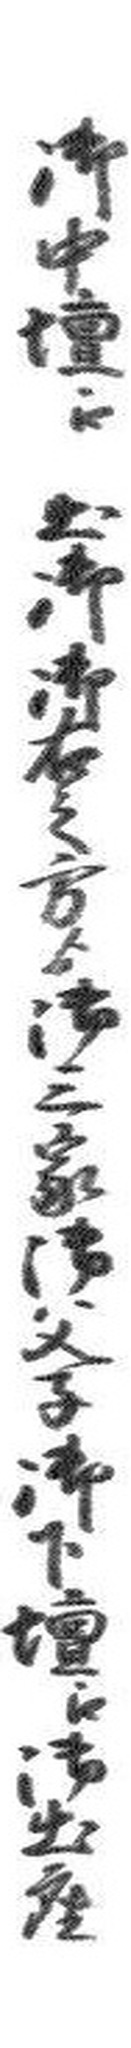御中壇江出御御右之方ゟ御三家御父子御下壇江御出座

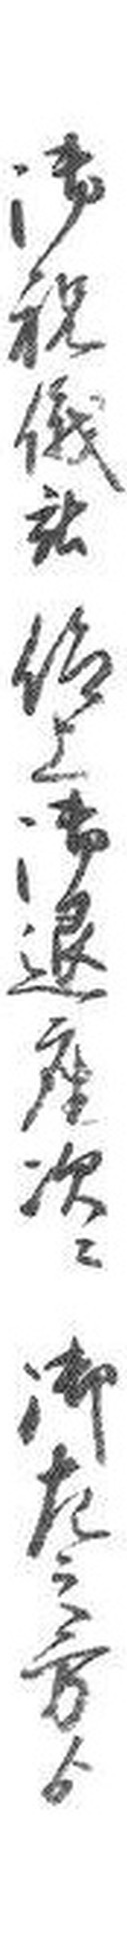御祝儀被仰上御退座次ニ御左之方ゟ
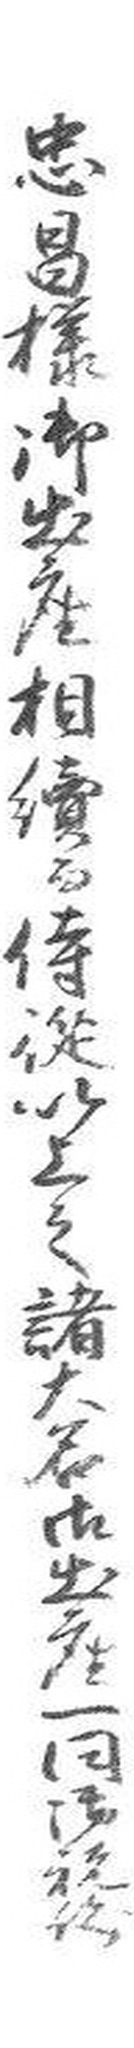忠昌様御出座相続而侍従以上之諸大名御出座一同御祝儀
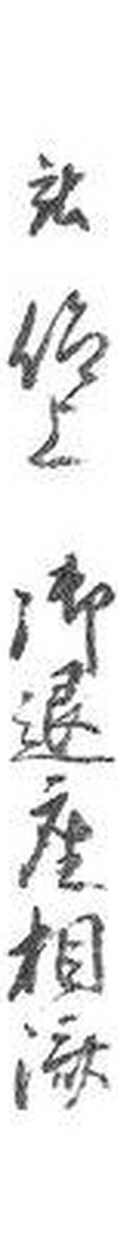被仰上御退座相済
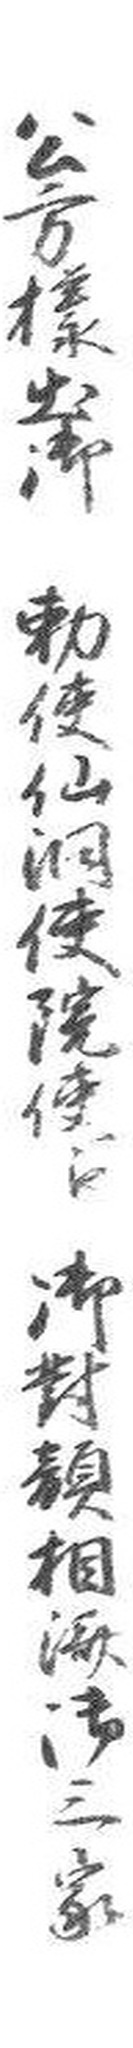公方様出御勅使仙洞使院使江御対顔相済御三家
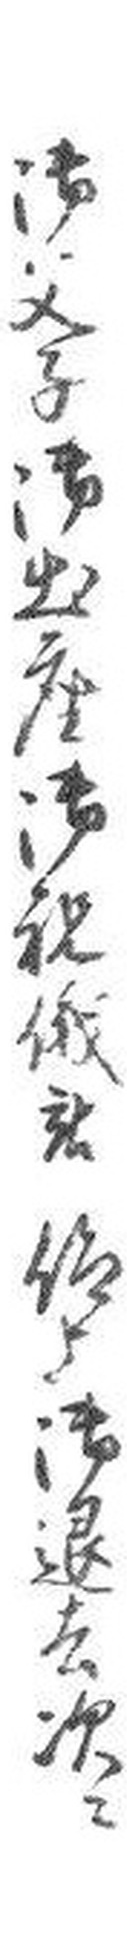御父子御出座御祝儀被仰上御退去次ニ
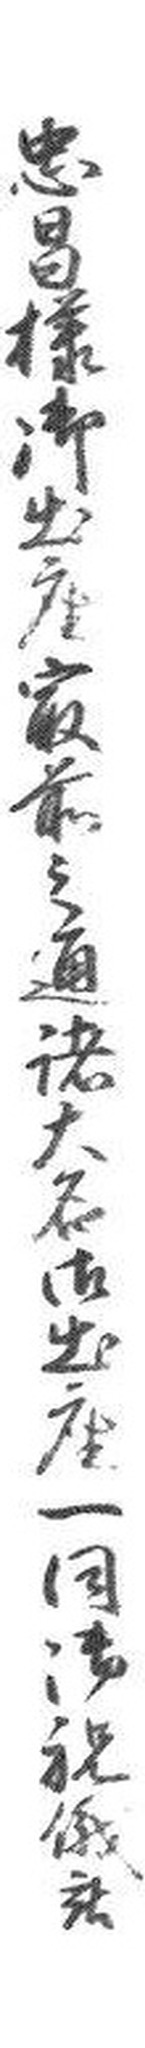忠昌様御出座最前之通諸大名御出座一同御祝儀被
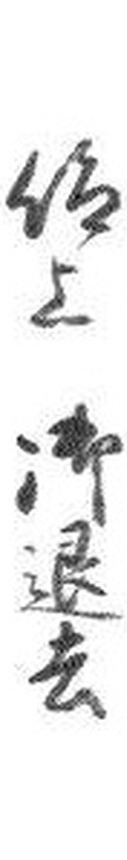仰上御退去
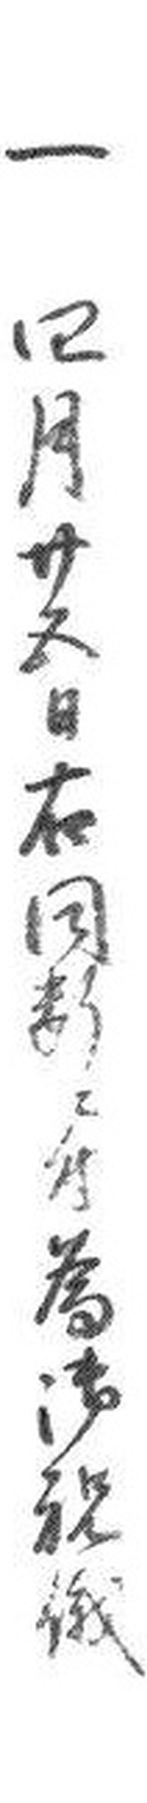一四月廿五日右同断ニ付為御祝儀
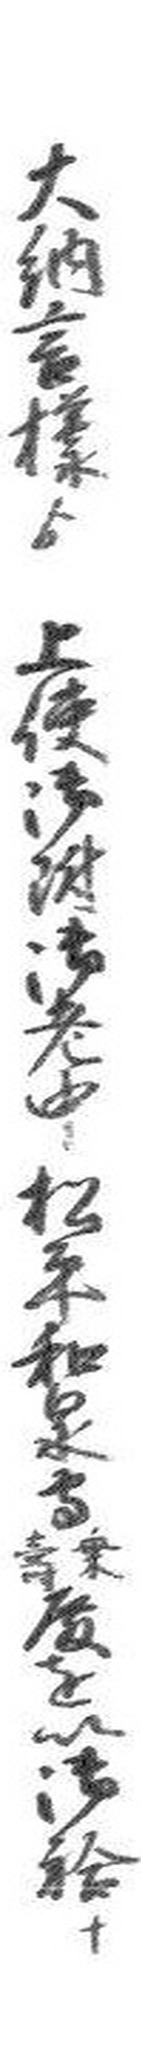大納言様ゟ上使御附御老中松平和泉守乗寿を以御袷十
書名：家譜 四 忠昌公 従寛永七年到正保四年
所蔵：福井県文書館 Fukui Prefectural Archives
